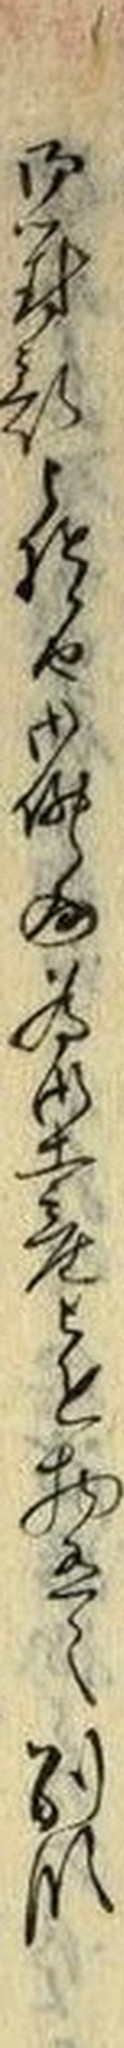御対顔被遊候由御例之通為御土産被進物有之別段
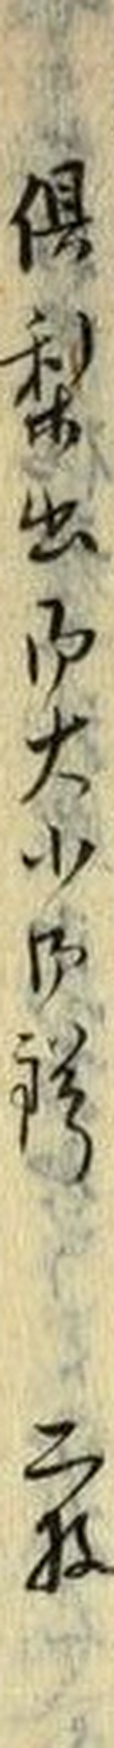俱梨出御大小御鍔二枚
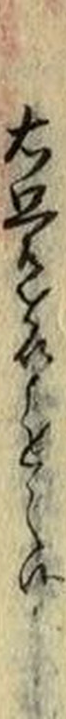右思召を以被進之候
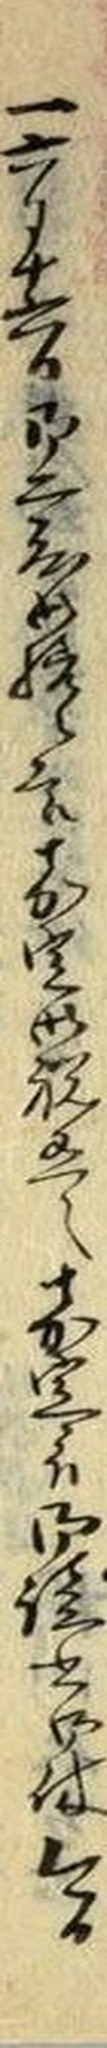一六月十六日御二度御膳之節嘉定御祝有之嘉定ニ付御読書御休今日
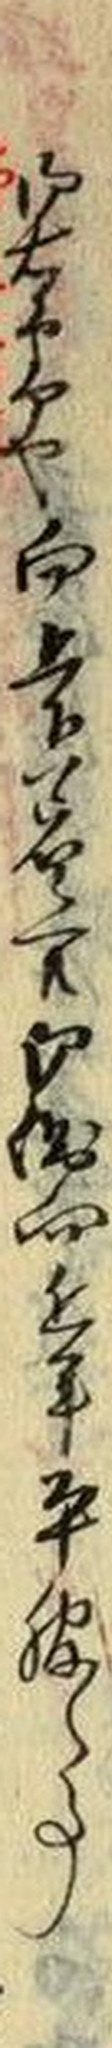御右筆部や向上下着候へ共御側向近年平服之事
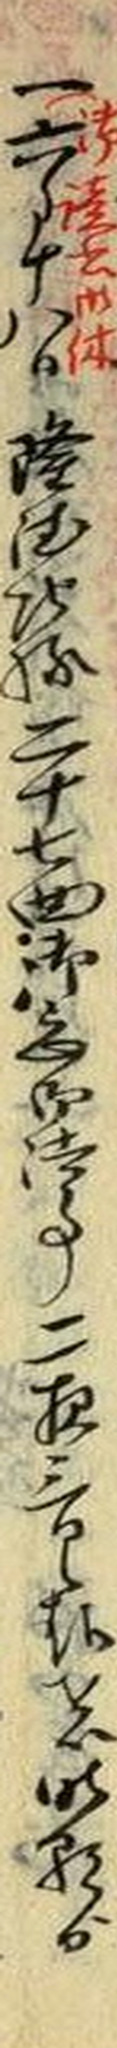一六月十八日隆徳院様二十七回御忌御法事二夜三日之趣を以昨朝ゟ
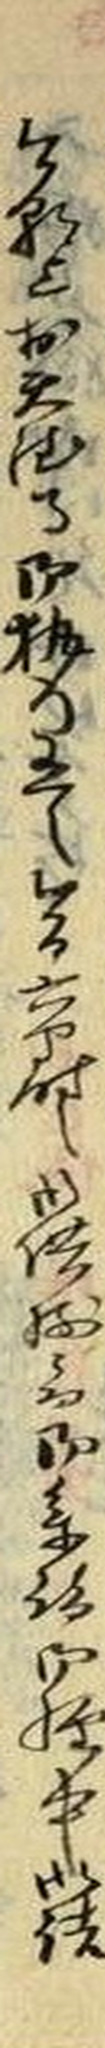今朝迄於天徳寺御執行有之今日六半時之御供揃ニ而御参詣御経中御詰
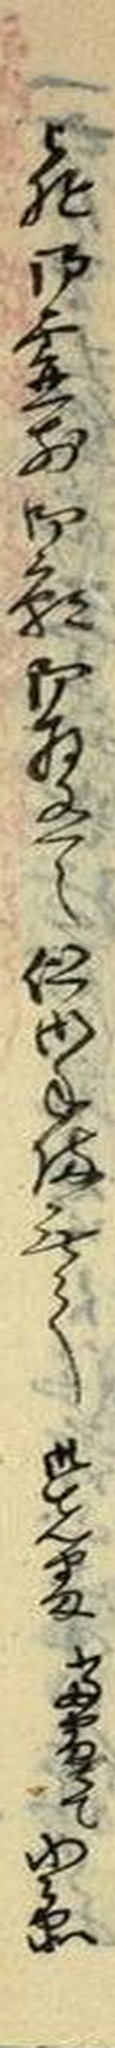被遊御霊前御廟御拝有之但御手備無之御先番当番ニて小兵衛
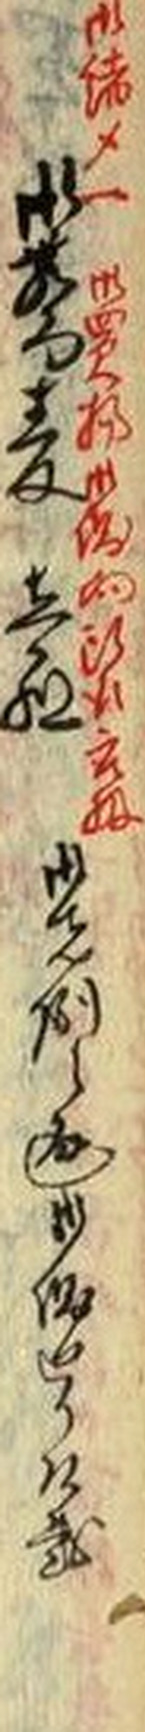御蕎麦壱組御先例之通御側廻り頂戴
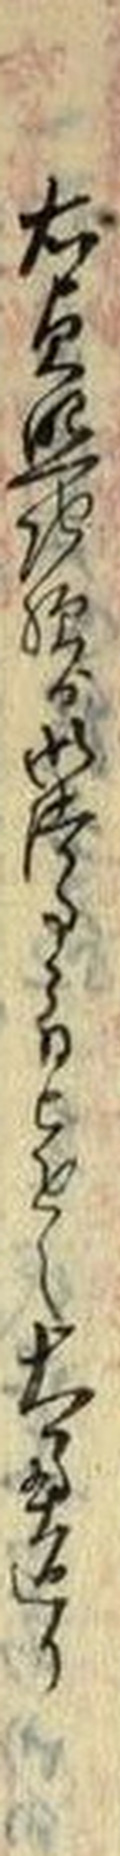右貞照院様ゟ御法事ニ付被進之大奥廻り
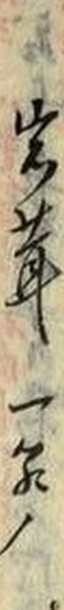岩茸一箱
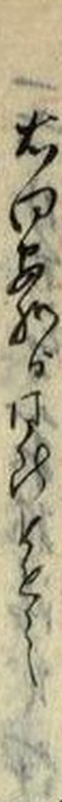右一橋様ゟ同断被進之
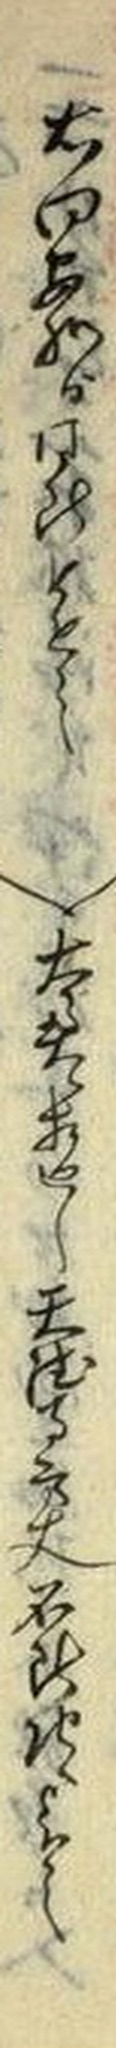右田安様ゟ同断被進之大奥へ相廻し天徳寺方丈不断院へ被下之
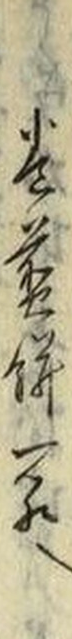巻煎餅一箱
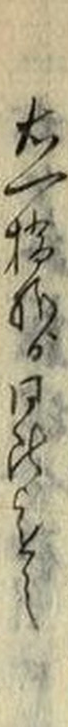右一橋様ゟ同断被進之
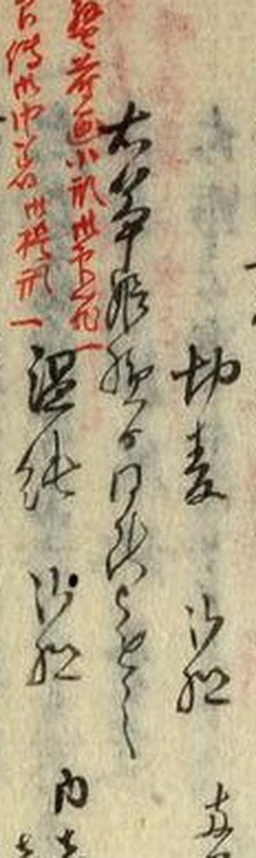右箏姫様ゟ同断被進之
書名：少傅日録抄（斉承付側向頭取日記、在府）
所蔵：福井県文書館 Fukui Prefectural Archives
